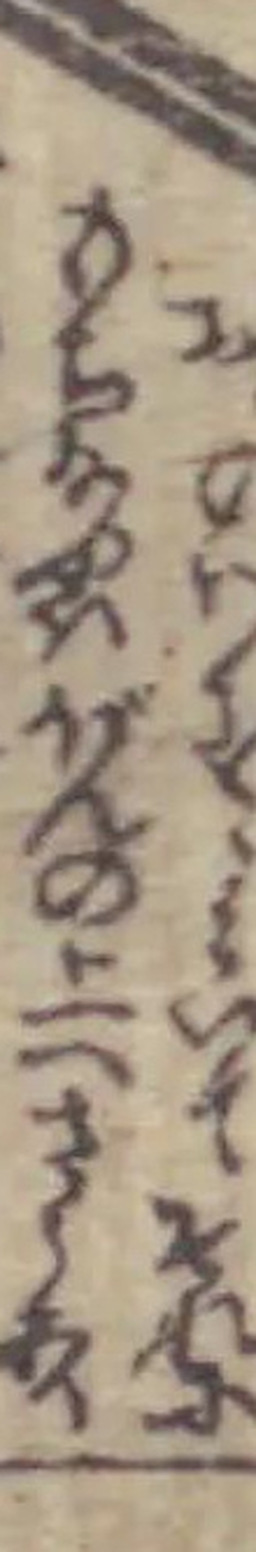もち給ふはぼんの上へさらあり
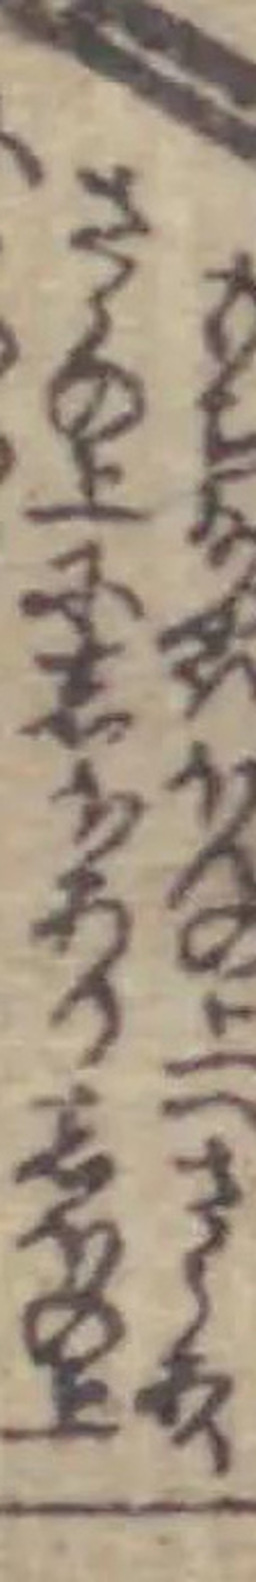さの上にしほありしほの上
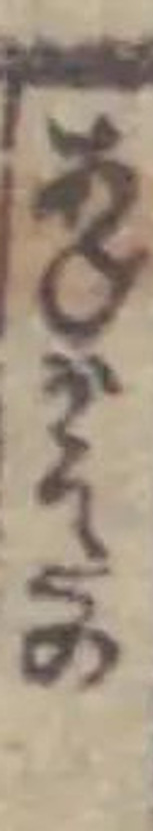あねがうたの
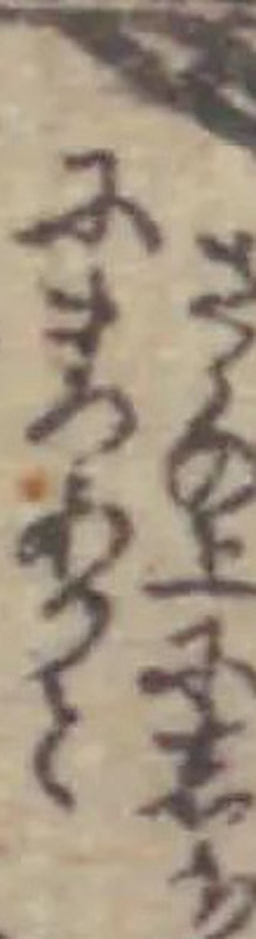にまつありと
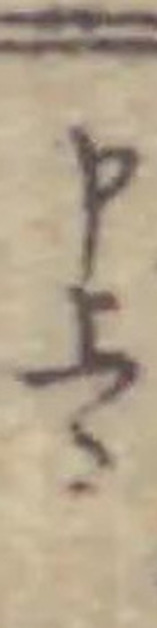申上ゝ
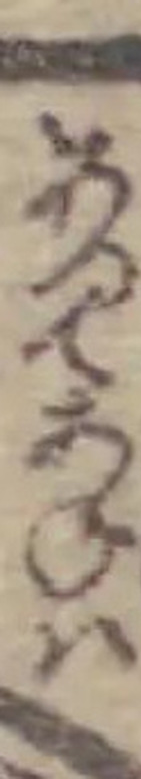あつてあねは
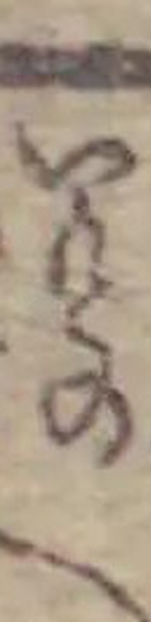いもとの
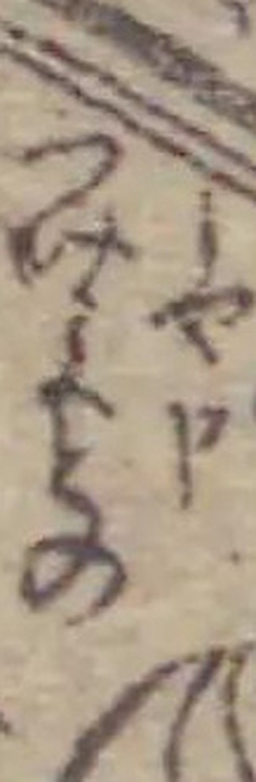つけよとの
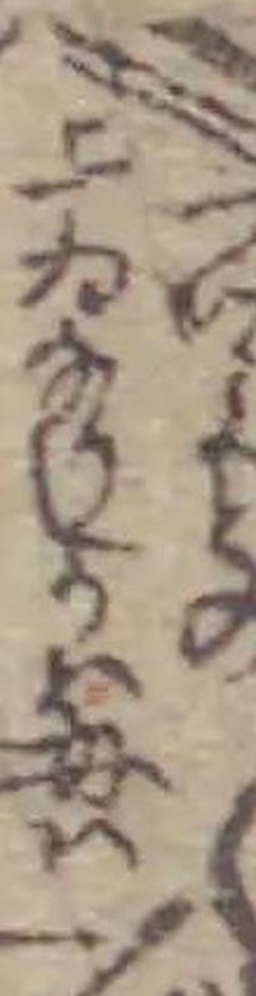上ゐなりしかは母は

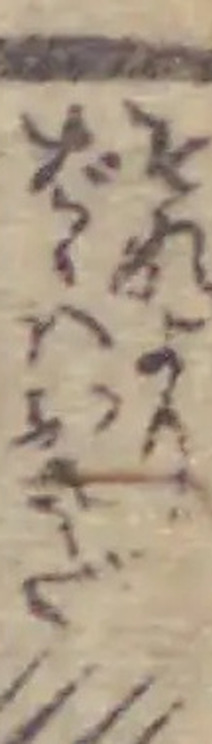ばゞはおさだ
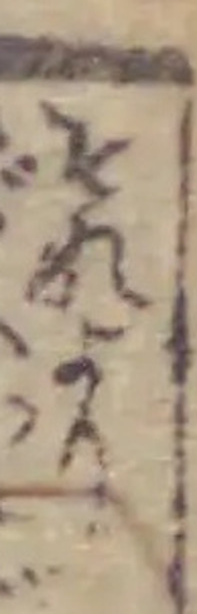それより
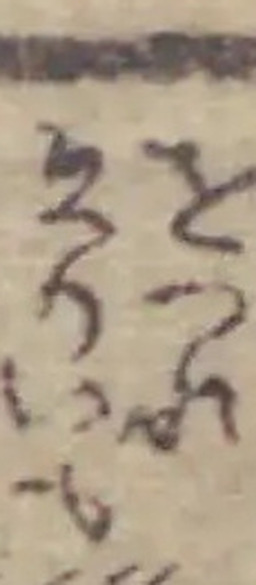かへりいも
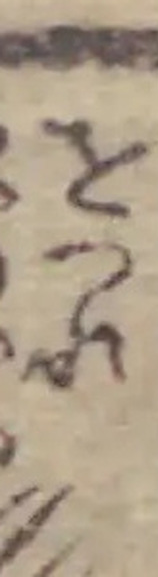をつれ
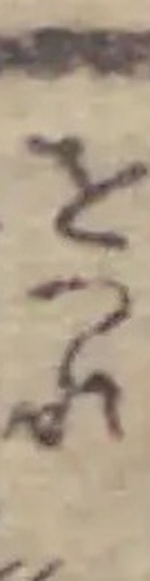をつれ
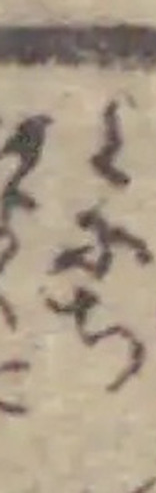とにち
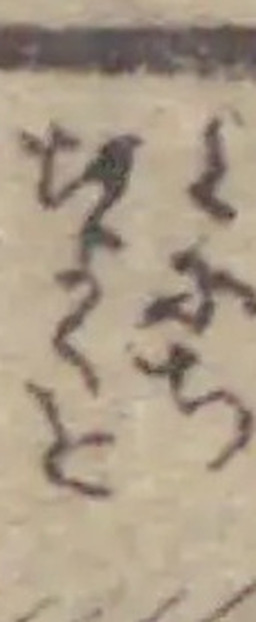ちよくを
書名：奥州咄 3巻
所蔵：国立国会図書館 National Diet Library, JAPAN
